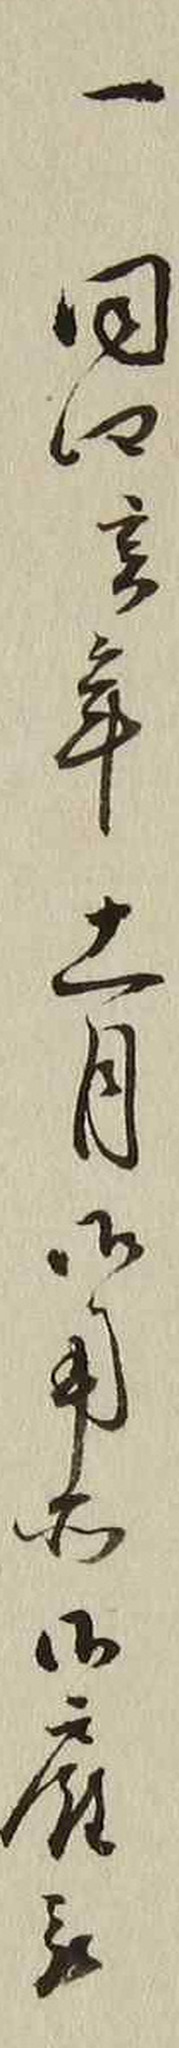一同四亥年十一月御用所御雇被
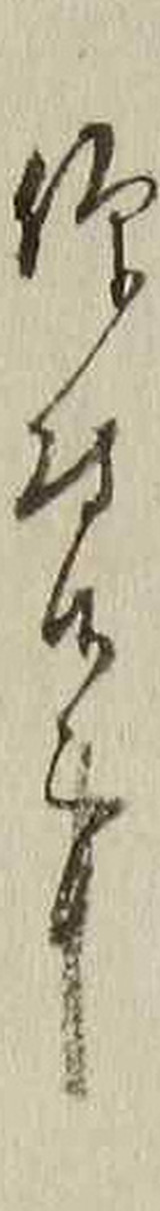仰付候事
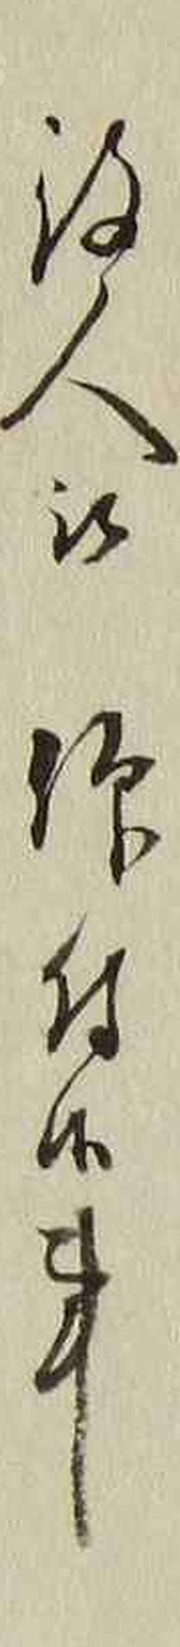役人江仰付候事
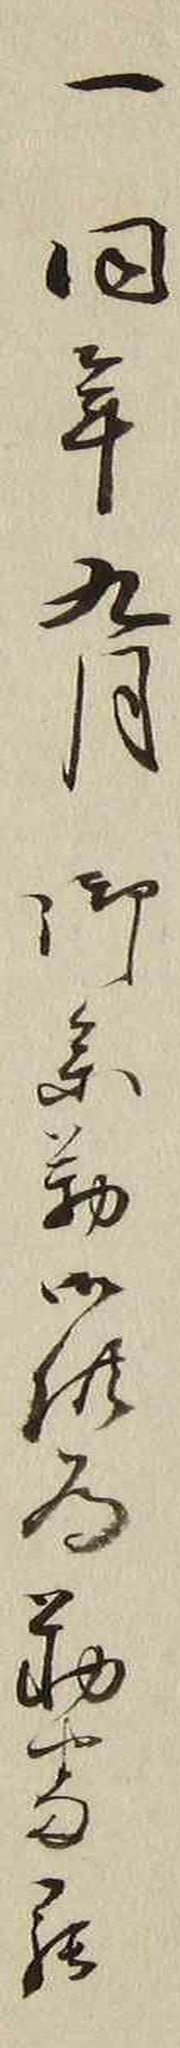一同年九月御参勤御供為勤番罷
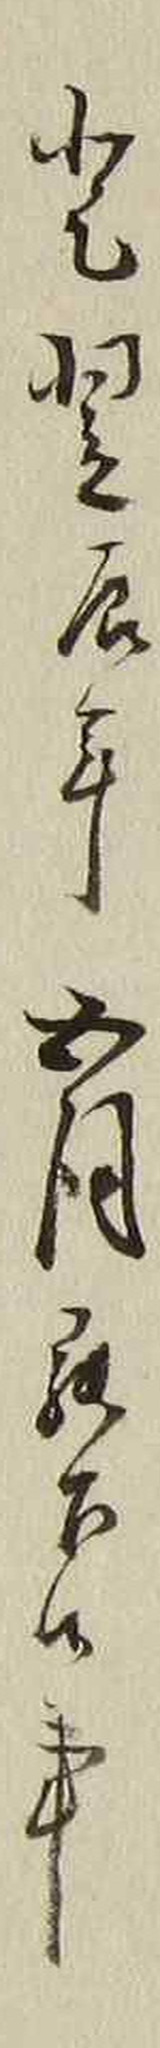登翌辰年五月罷下候事
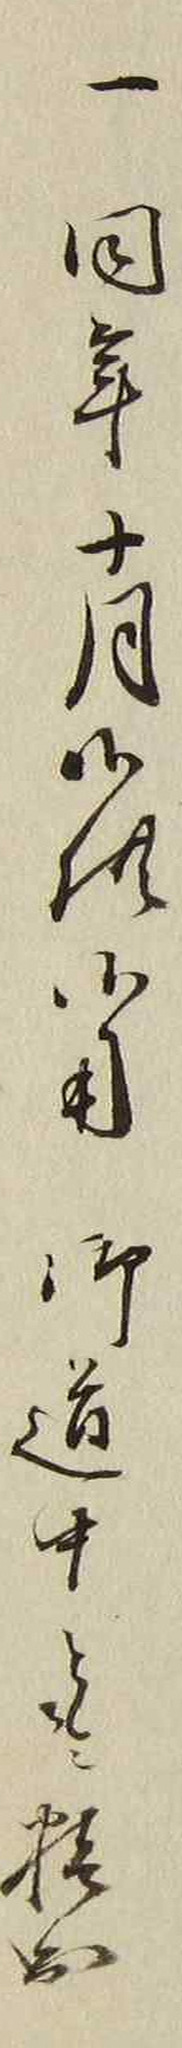一同年十月御供御用御道中ともニ精出
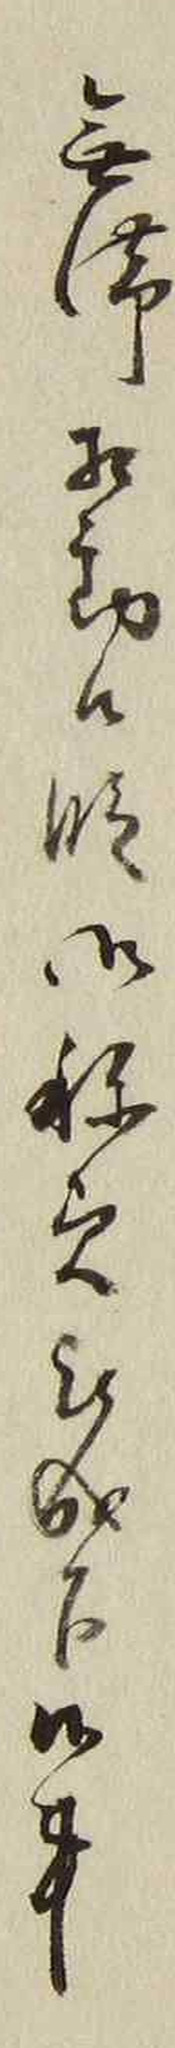無滞相勤候段御称美被成下候事
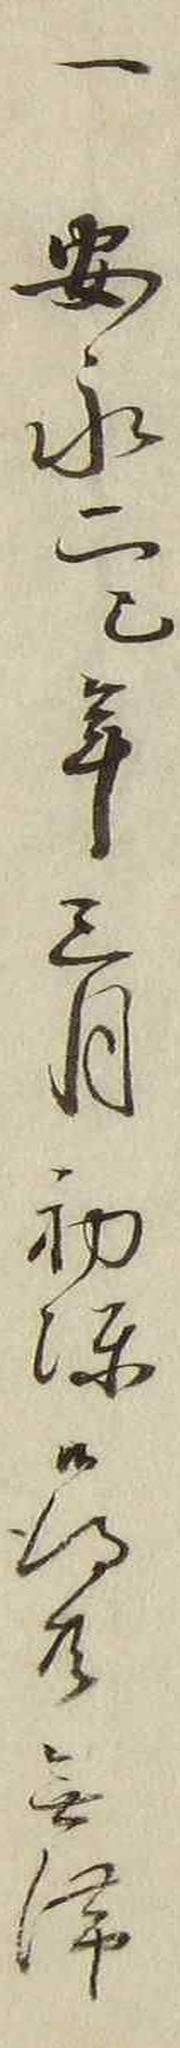一安永二巳年三月初陣候得共無滞

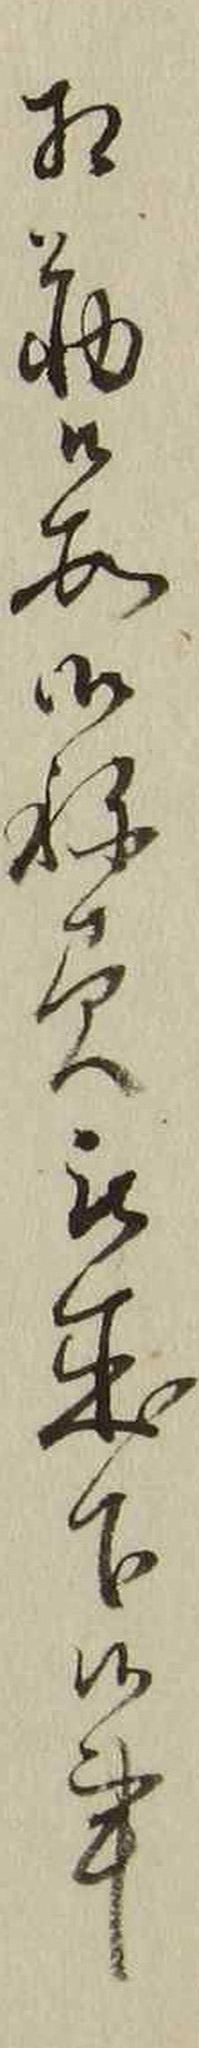相勤候段御称美被成下候事
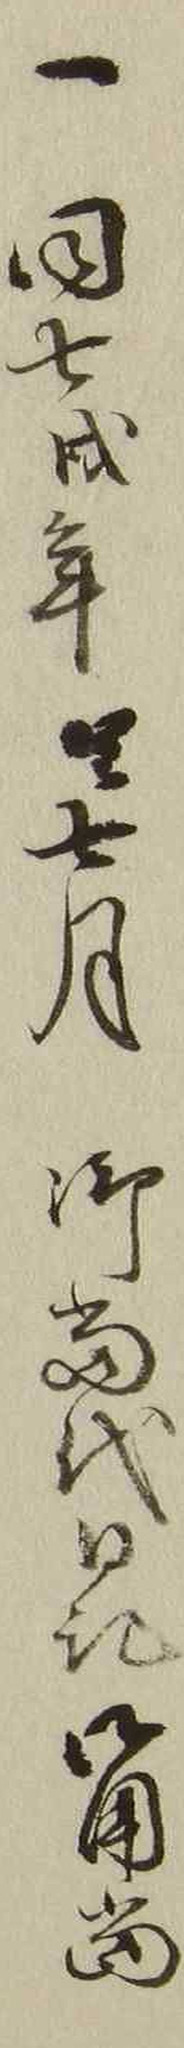一同七戌年閏七月御当代日記御用当
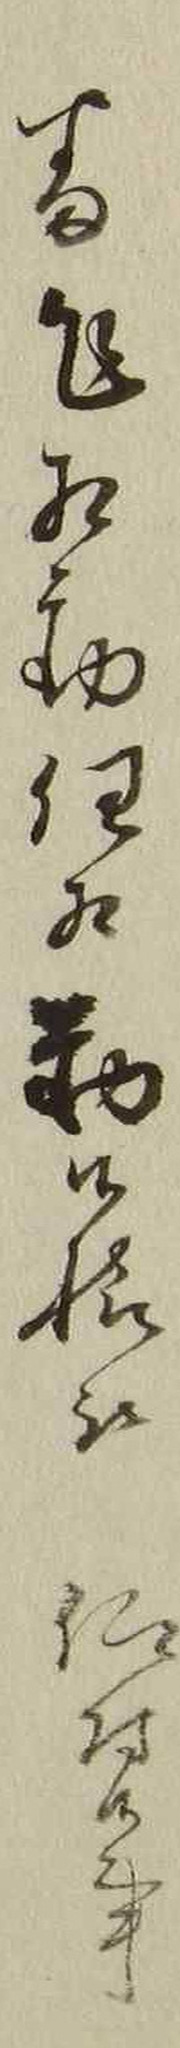番乍相勤任相勤候様被仰付候事
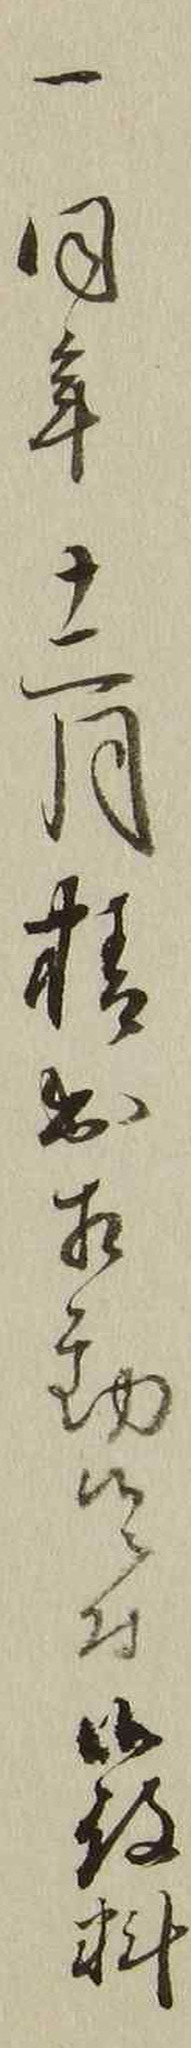一同年十二月精出相勤候ニ付御役料
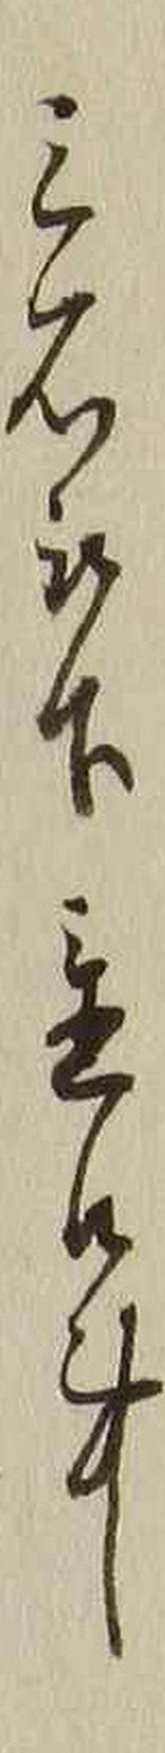三石被下置候事
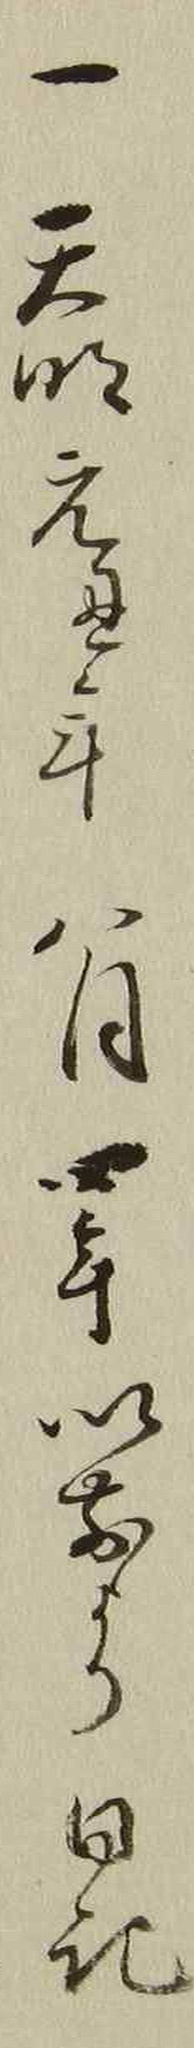一天明元丑年八月四年以前より日記
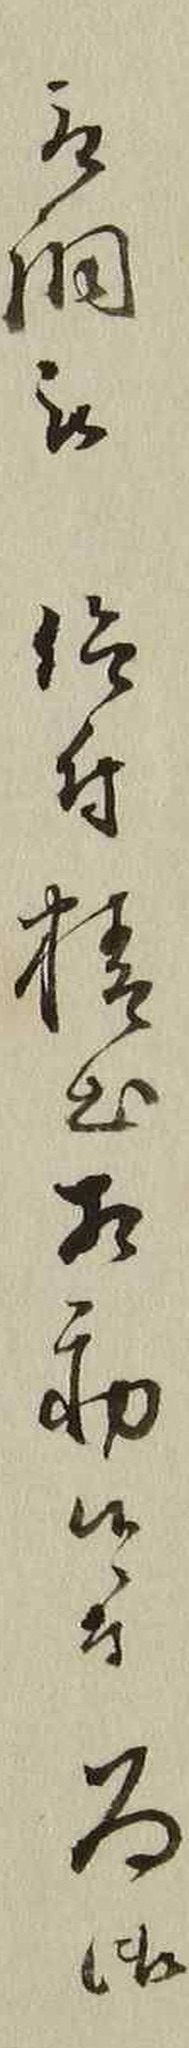取調被仰付精出相勤候ニ付為御
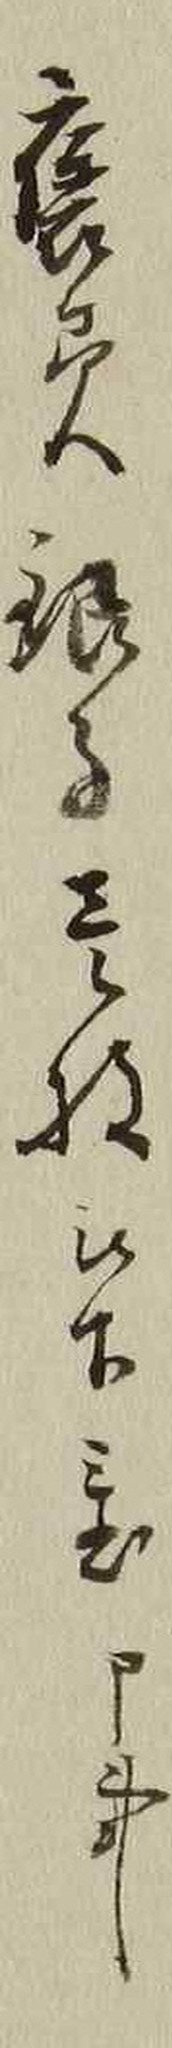褒美銀子壱枚被下置申事
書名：諸士系譜　巻之129　た之部5
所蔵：会津若松市立会津図書館
